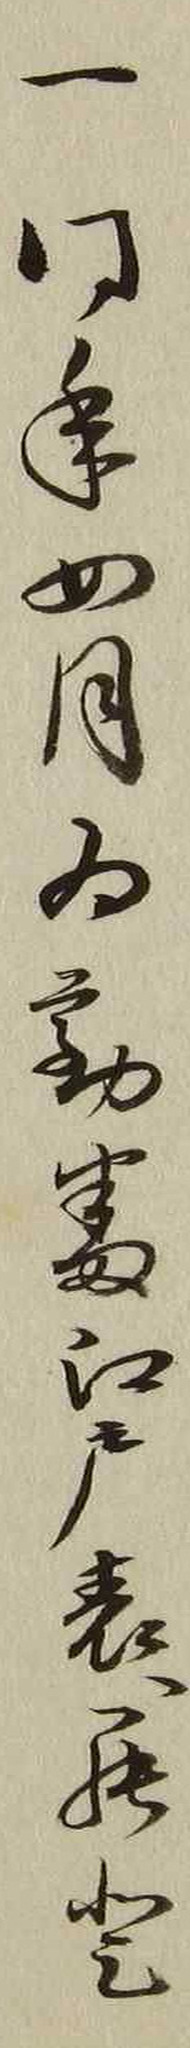一同年四月為勤番江戸表罷登
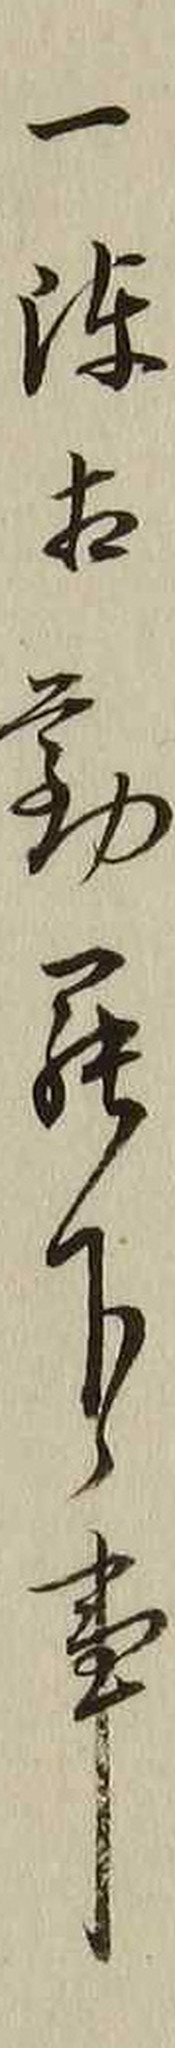一陣相勤罷下候事
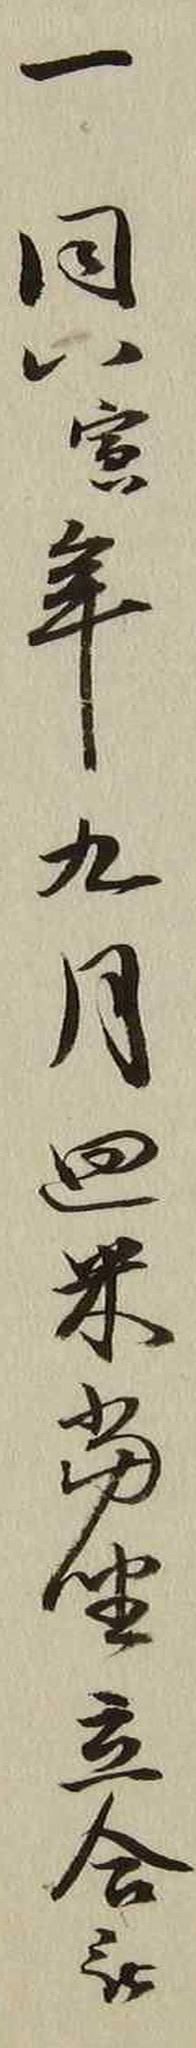一同八寅年九月廻米当野立合被
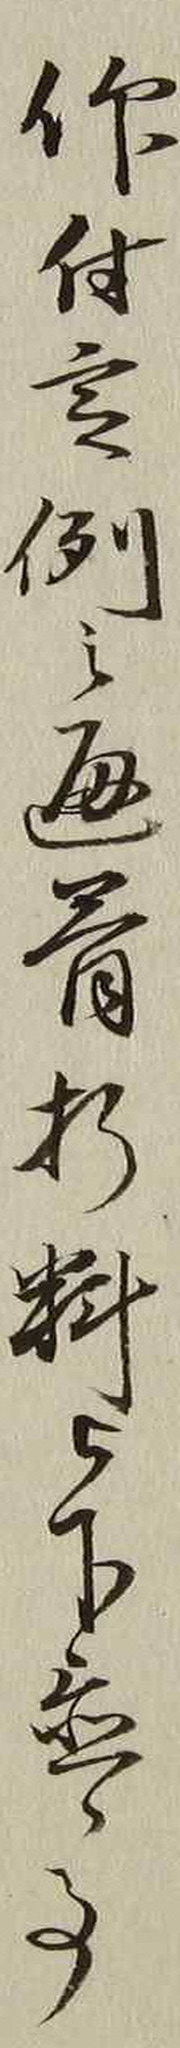仰付定例之通骨折料被下置候事
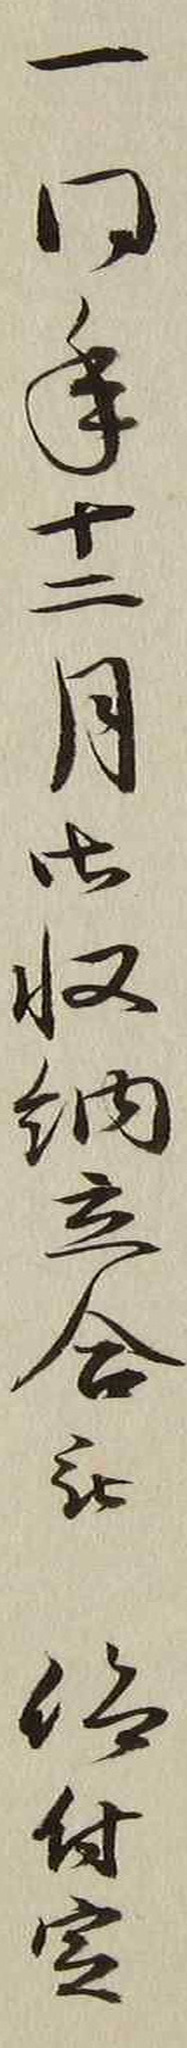一同年十二月御収納立合被仰付定
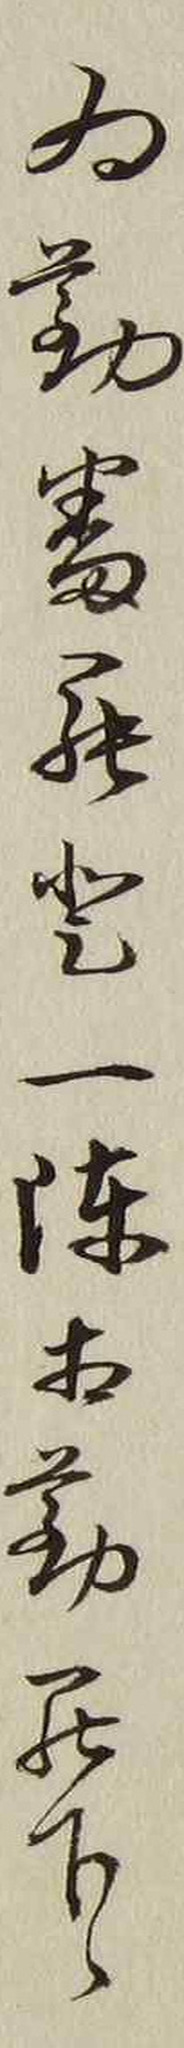為勤番罷登一陣相勤罷下候
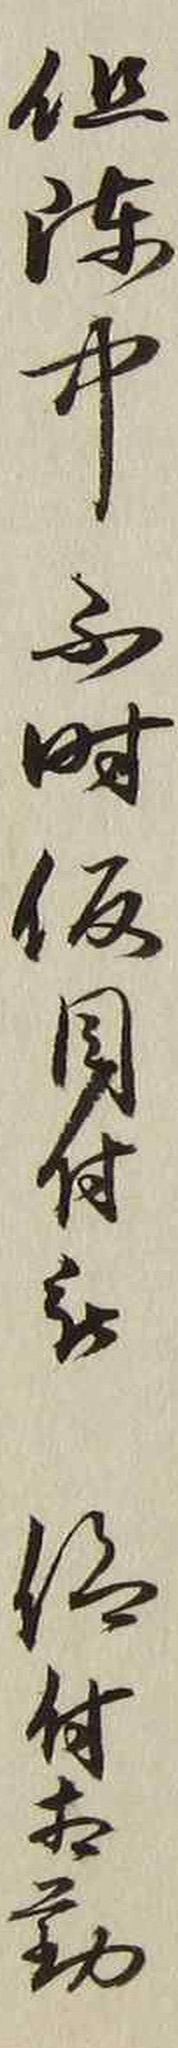但陣中不時仮目付被仰付相勤
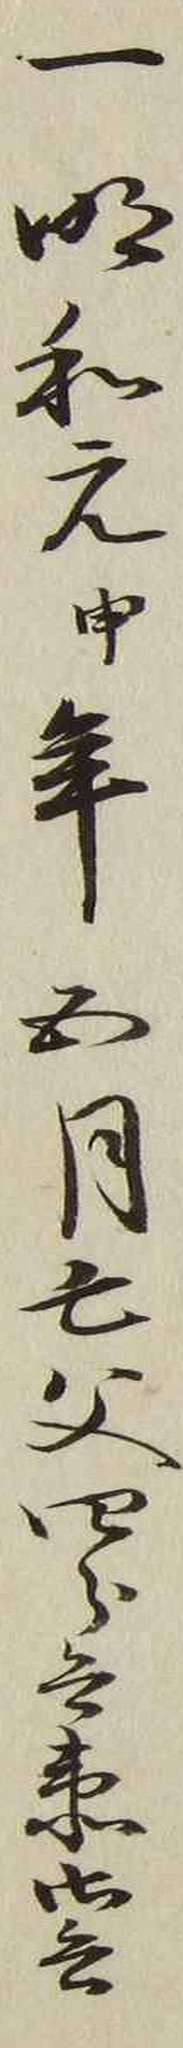一明和元申年五月亡父四郎兵衛御兵

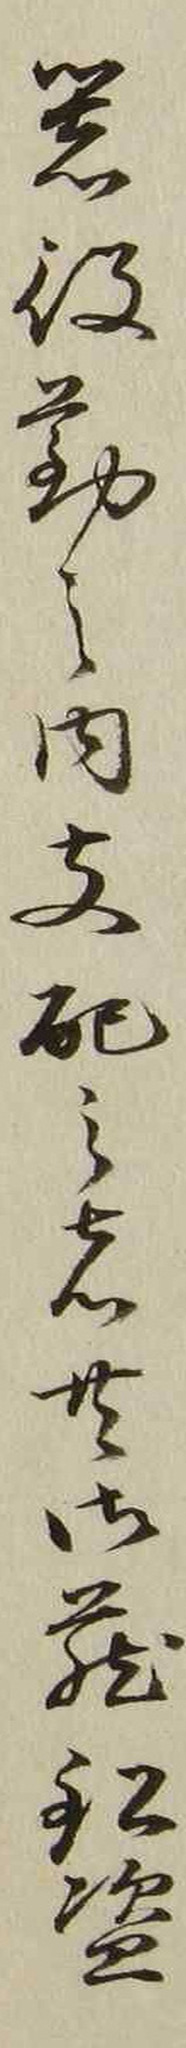器役勤之内支配之者共御蔵鉛盗
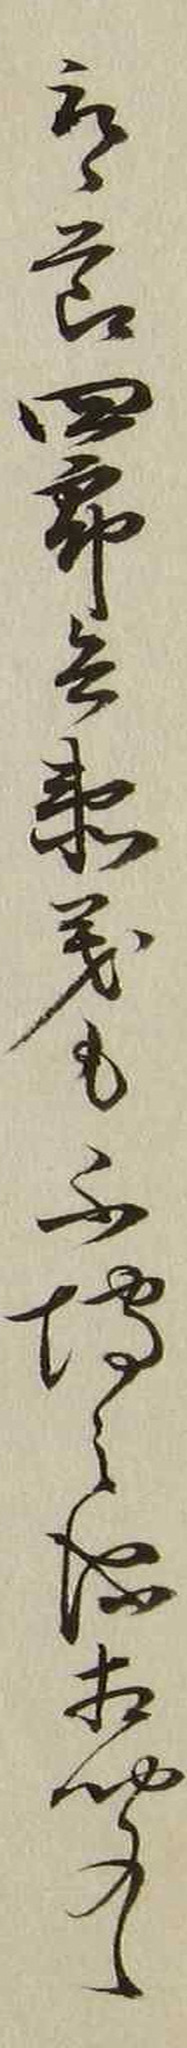取候節四郎兵衛義も不埒之儀相聞候
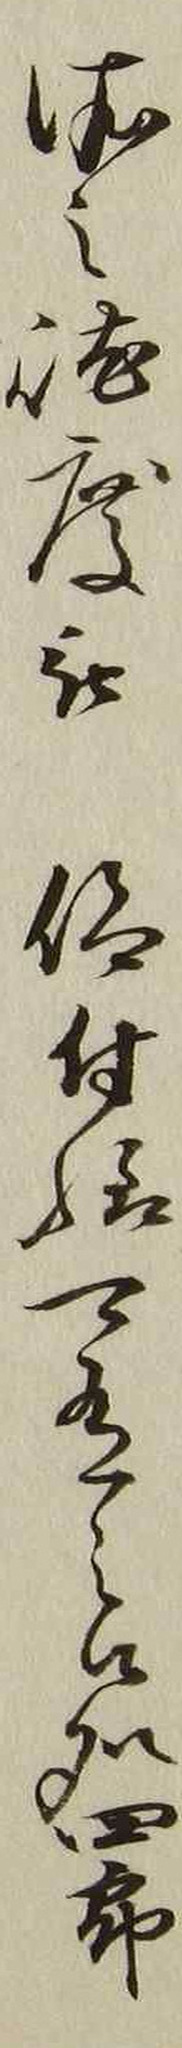依之徳度被仰付様可有之候処四郎
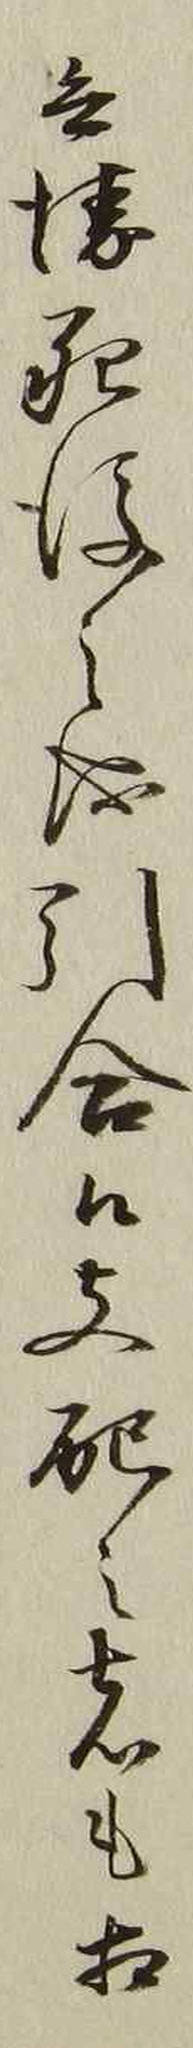兵衛死後之儀引合候支配之者も相
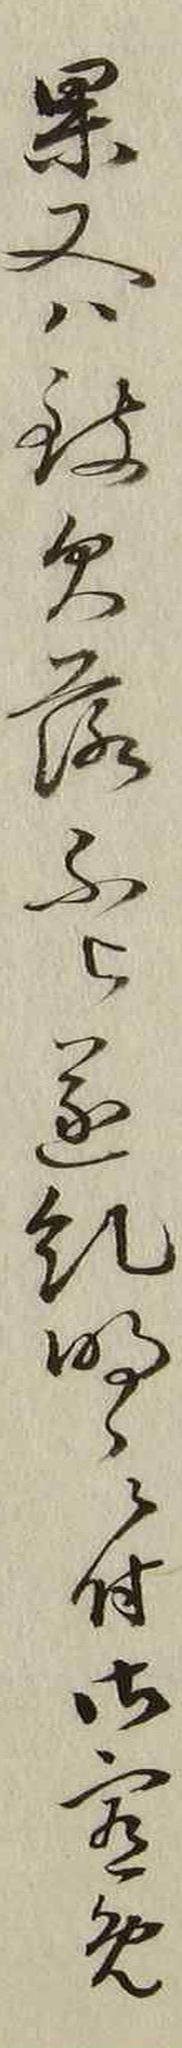果又は致欠落不被遂糺明候付御宥免
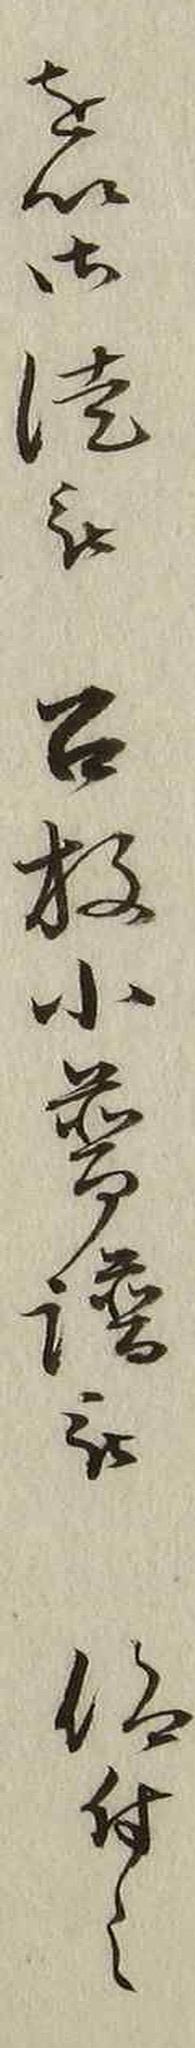を以御徒被召放小普請被仰付之
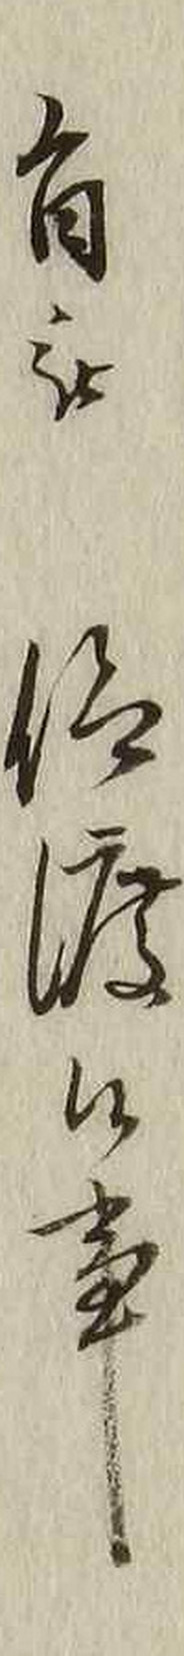旨被仰渡候事
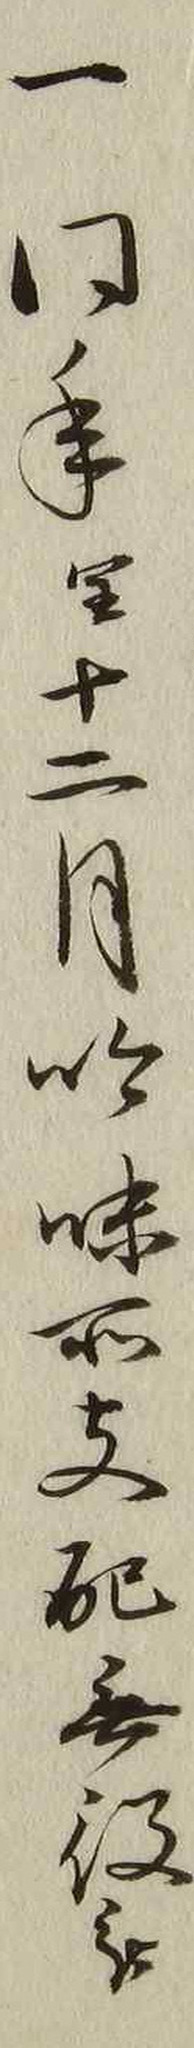一同年閏十二月吟味所支配無役被
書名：諸士系譜　巻之102　か之部10
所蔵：会津若松市立会津図書館
